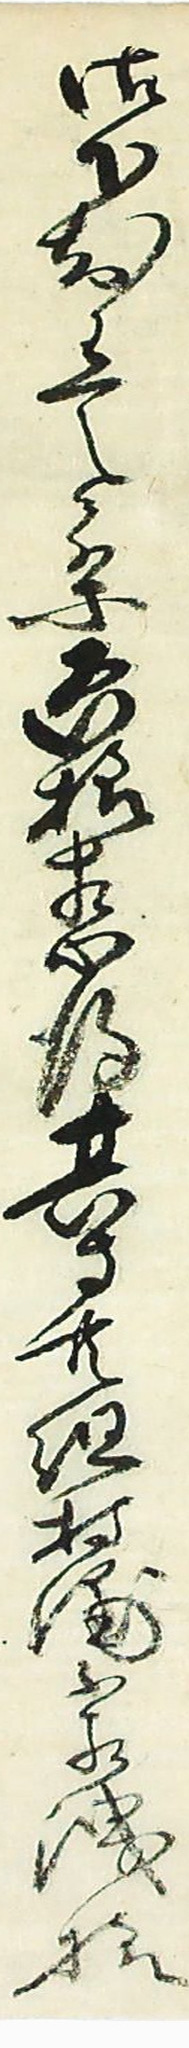御下知有之候条右様相心得其方共組村浦不相洩様
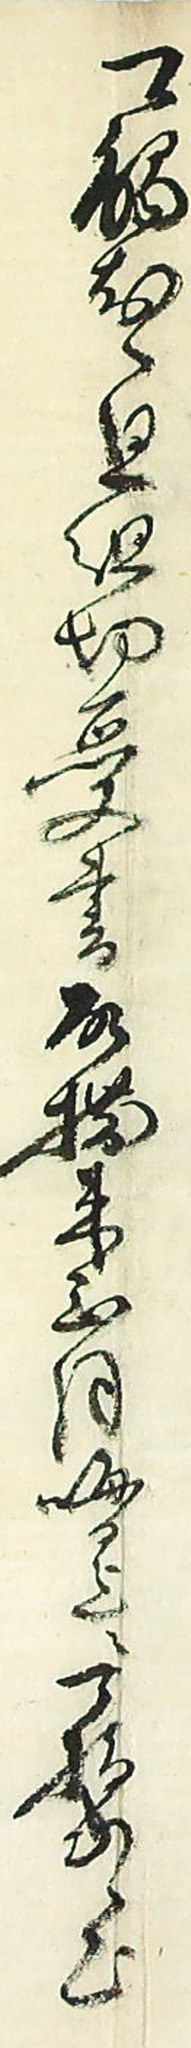可触知候且組切受書取揃来正月晦日迄に可指出候以上
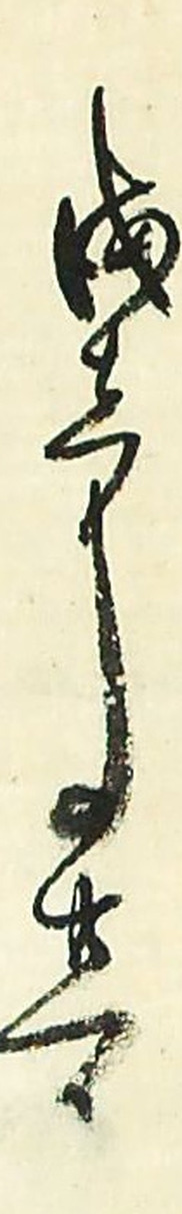戌十二月廿一日
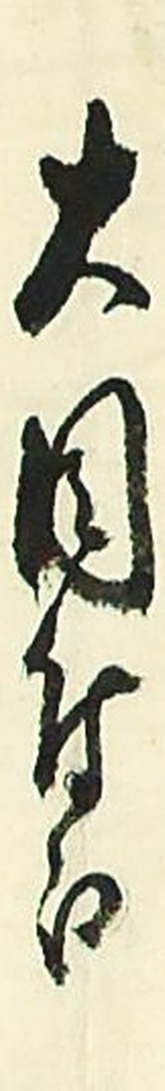大目付江
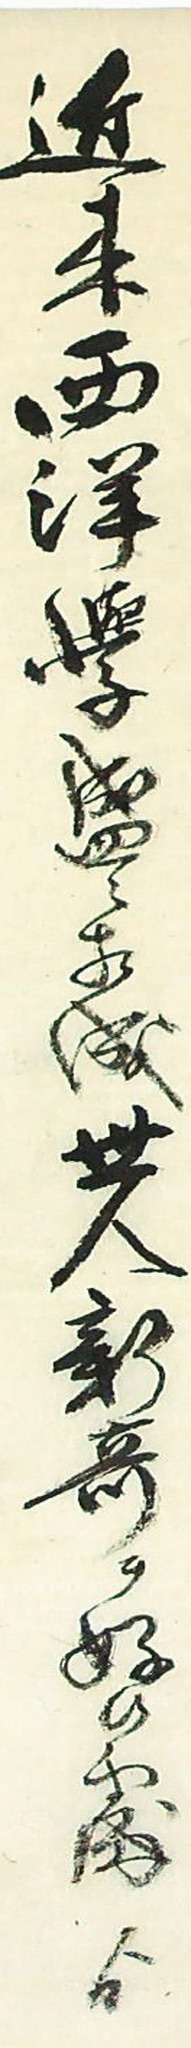近来西洋学盛に相成世人新奇を好候処ゟ
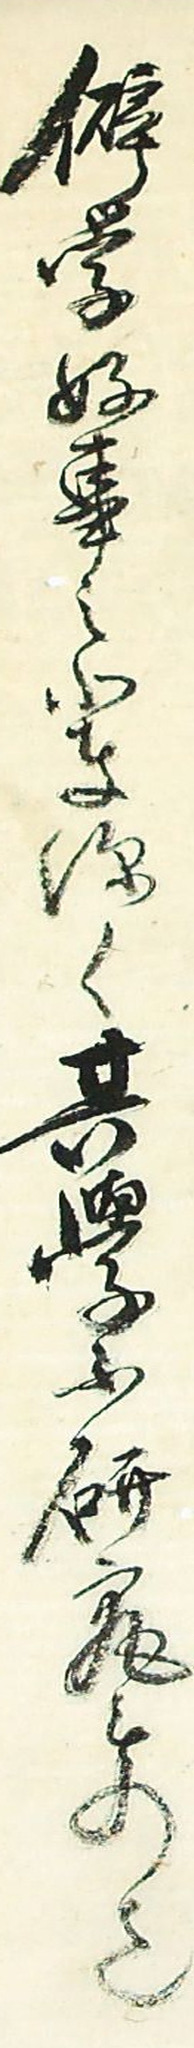僻学好事之輩深く其学不研究もの迄
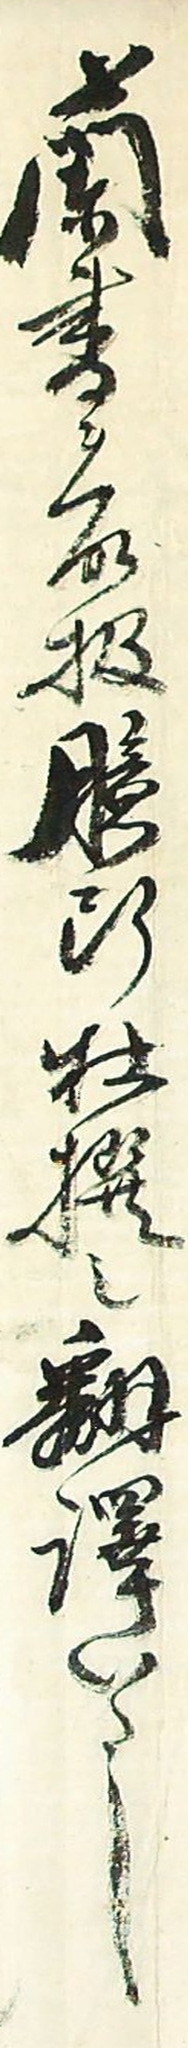蘭書を取扱臆断杜撰之翻訳いたし
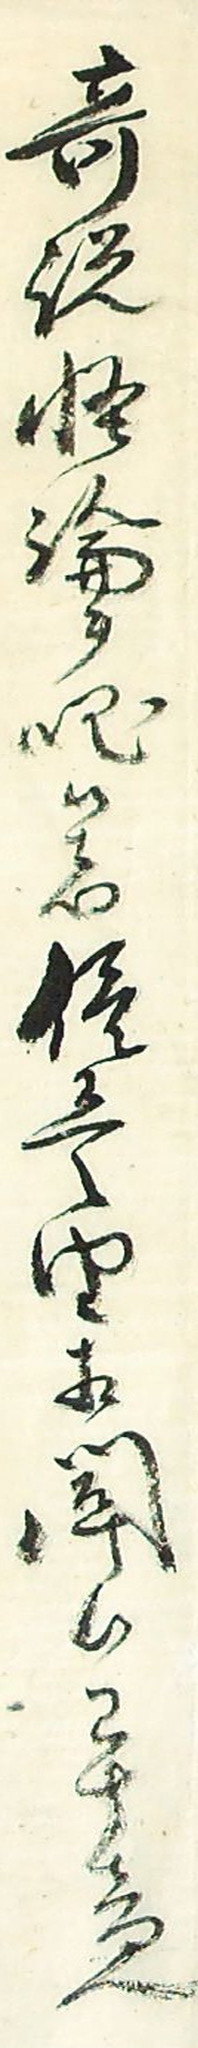奇説怪論を唱候者侭有之由相聞候畢竟
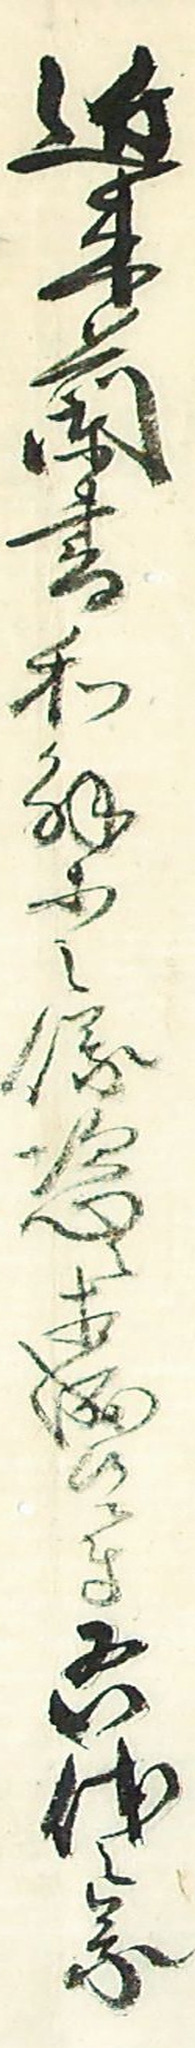近来蘭書和解等之儀恣に相成候に付右体之義
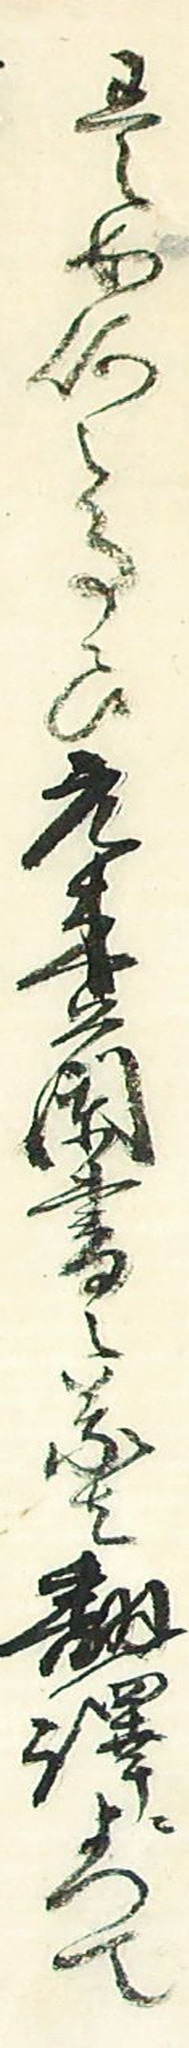有之如何之事に候元来蘭書之義は翻訳によつて
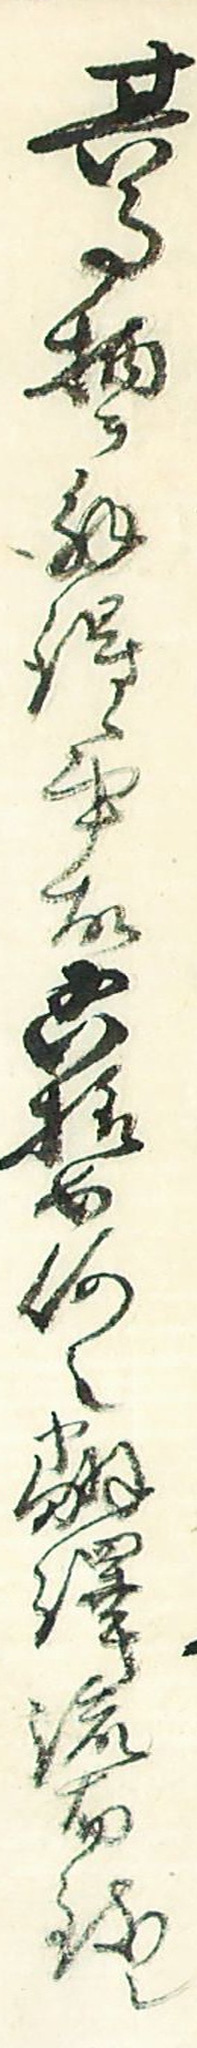其事柄を解得候事故右様如何之翻訳流布致し
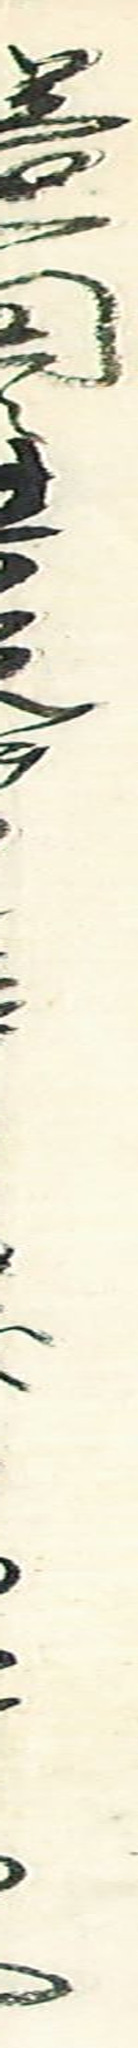若一図に其説をのみ信し候様成心得違之者も

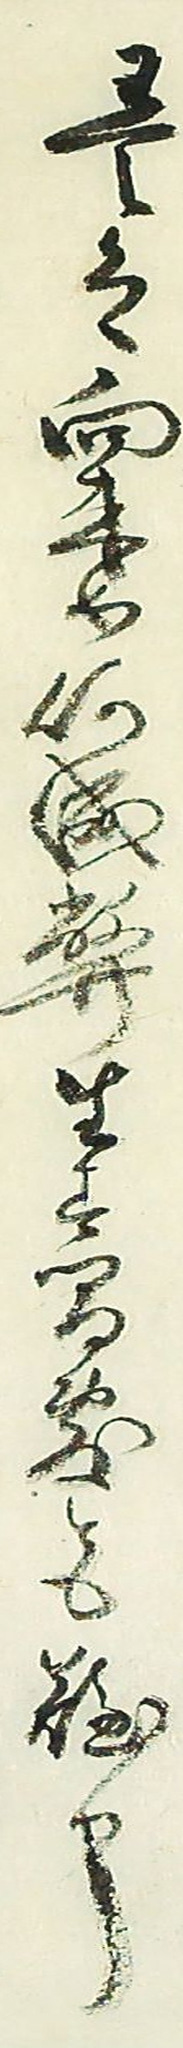有之候はゝ向来如何成弊生す間敷とも難申
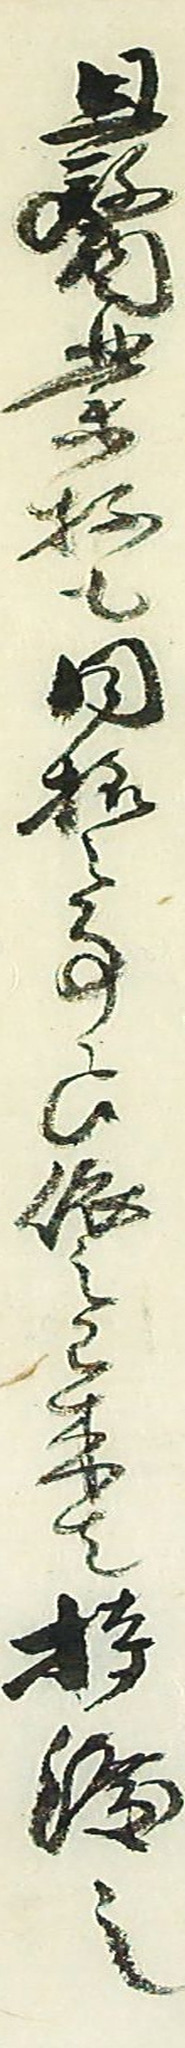且医業抔も同様之事に候依之已来は持渡之
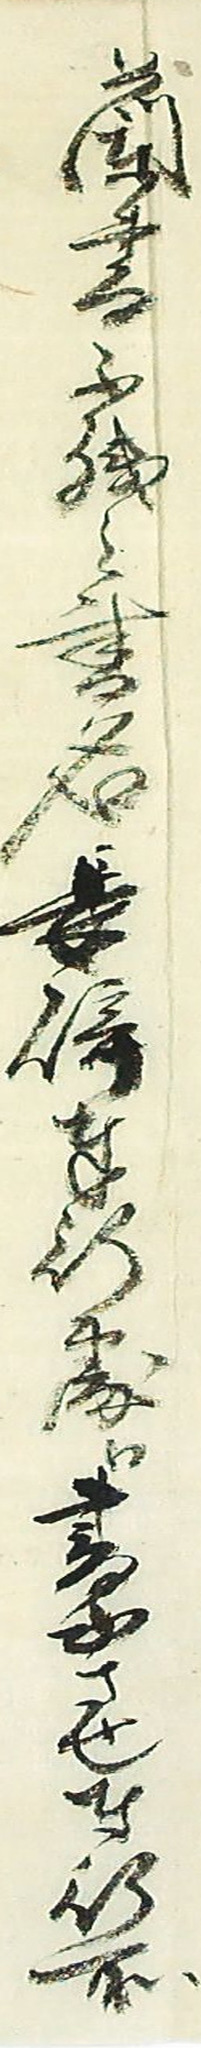蘭書不残之書名長崎奉行処江書出させ奉行所
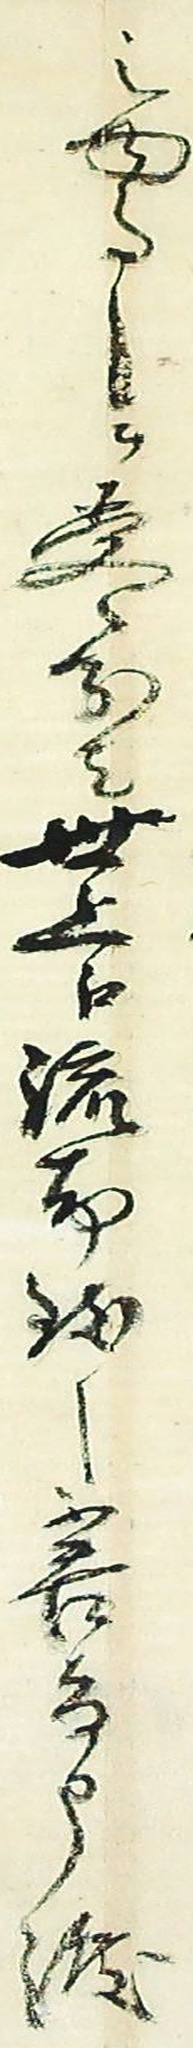之ゆるしを受候分は世上江流布致し不苦旨申渡
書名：諸御用御□受書控
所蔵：鳴門教育大学 Naruto University of Education
